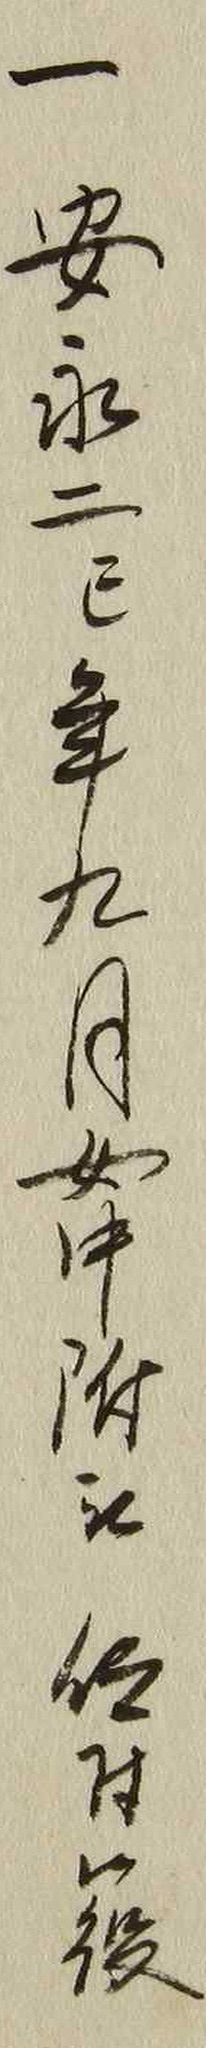一安永二巳年九月女中附被仰付御役
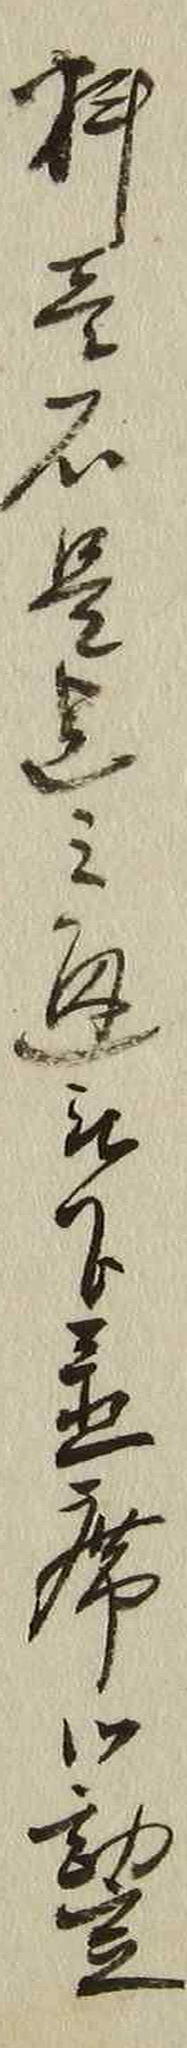料壱石是迄之通被下置席御勘定
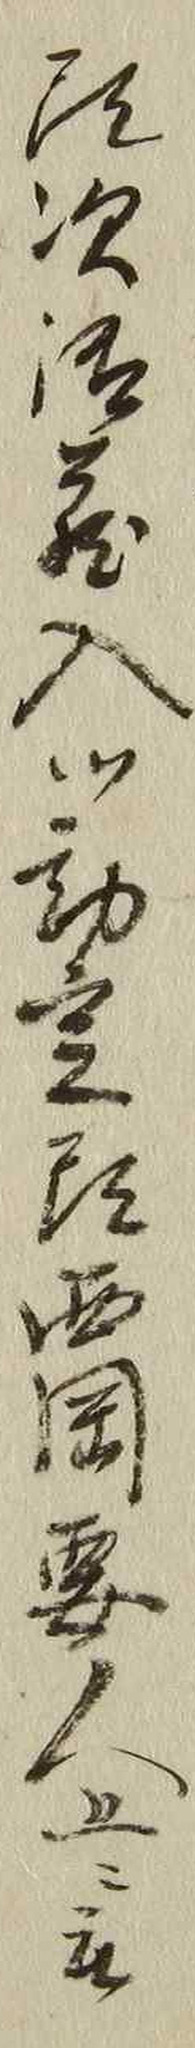頭次御蔵入御勘定頭西岡要人上ニ被
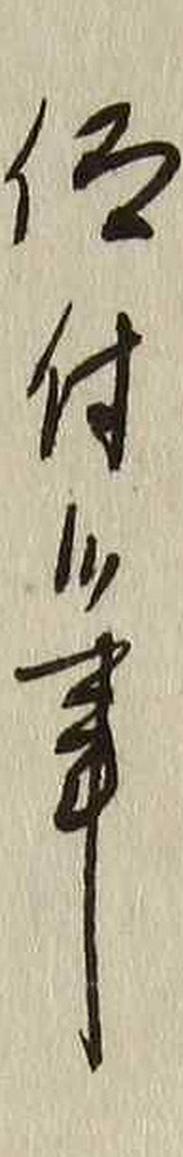仰付候事
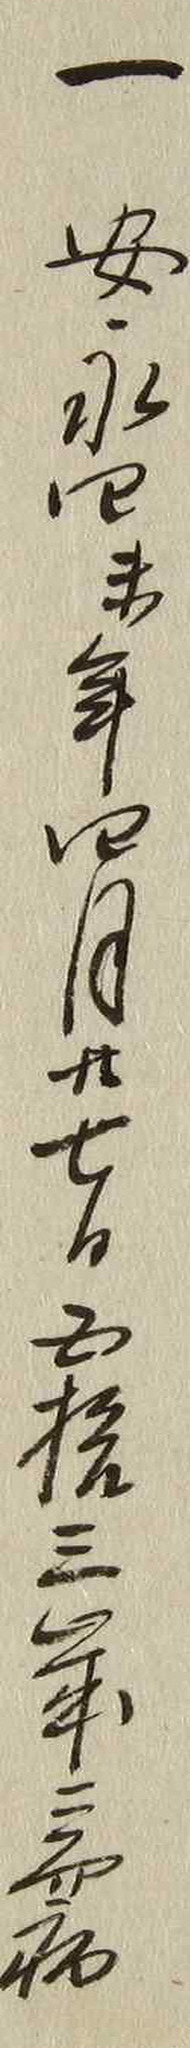一安永四未年四月廿七日五拾三歳ニ而病
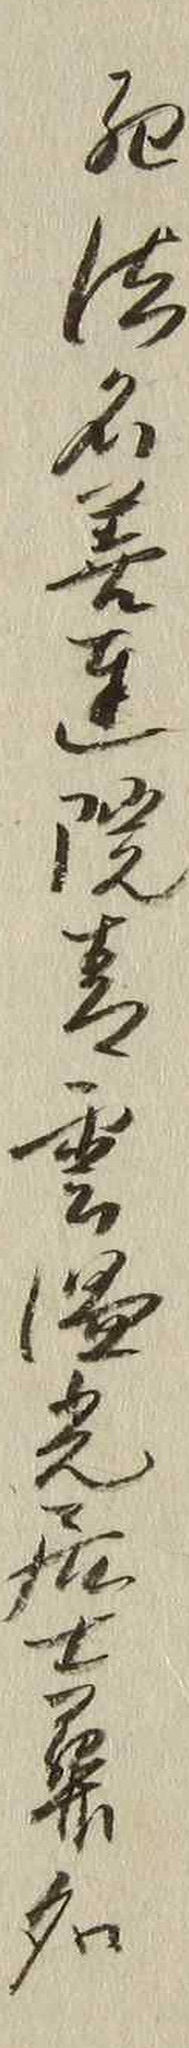死法名善達院青雲温光居士葬処
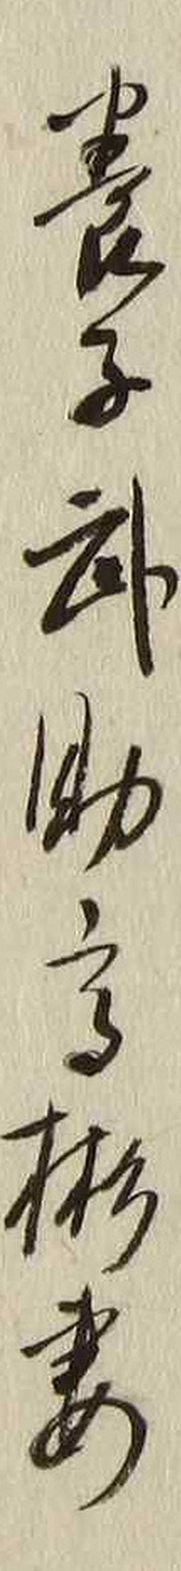女養子武助高彬妻
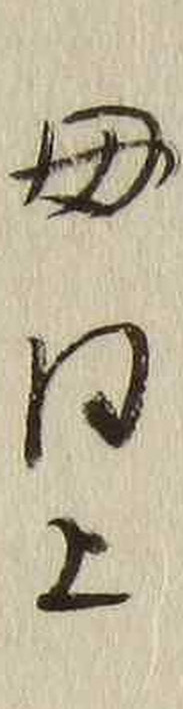母同上
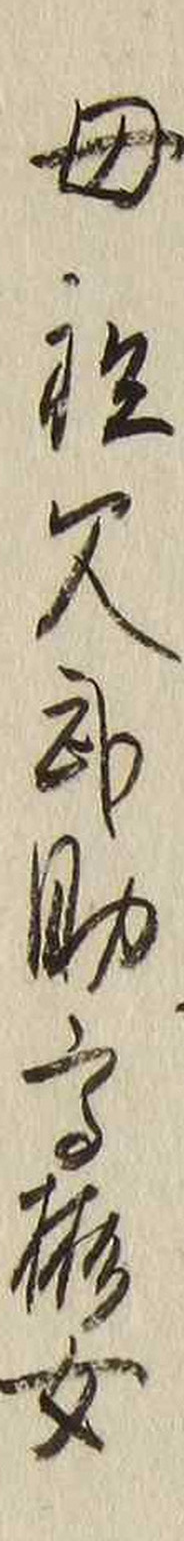母祖父武助高彬女

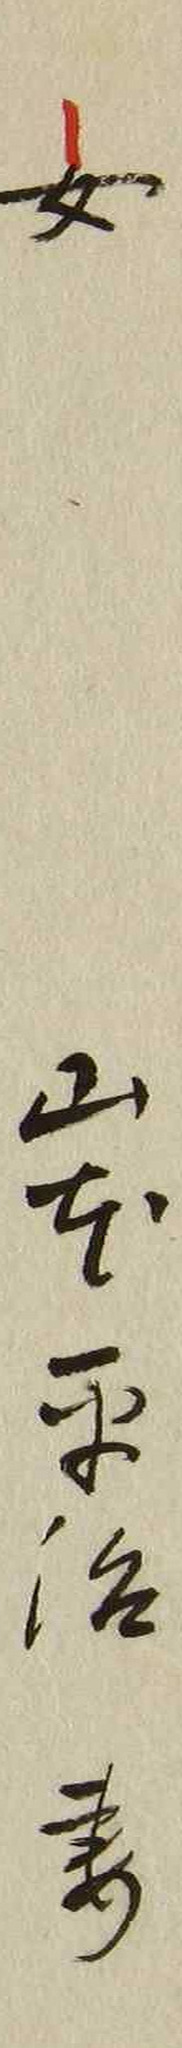女山本平治妻
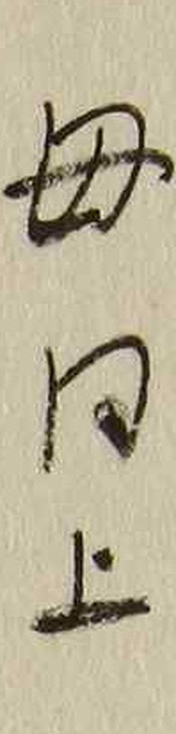母同上
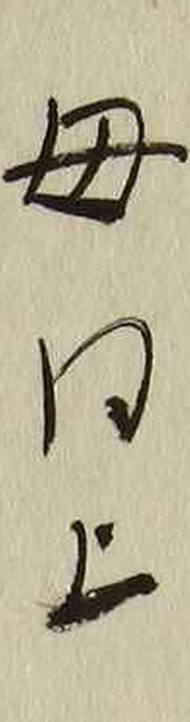母同上
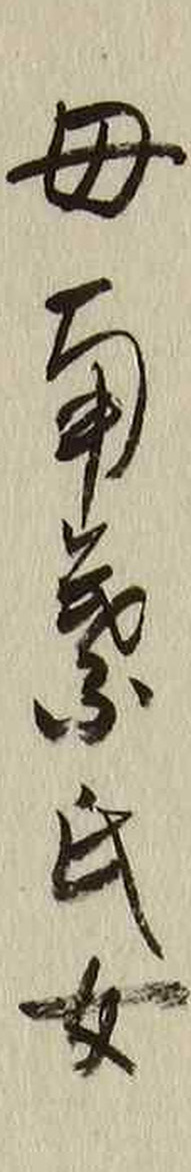母南葉氏女
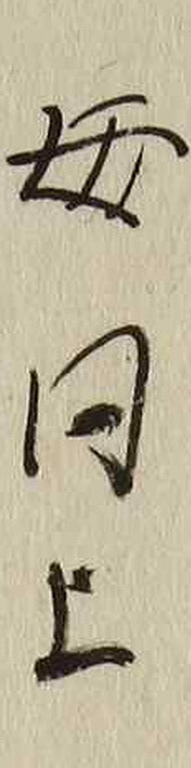母同上
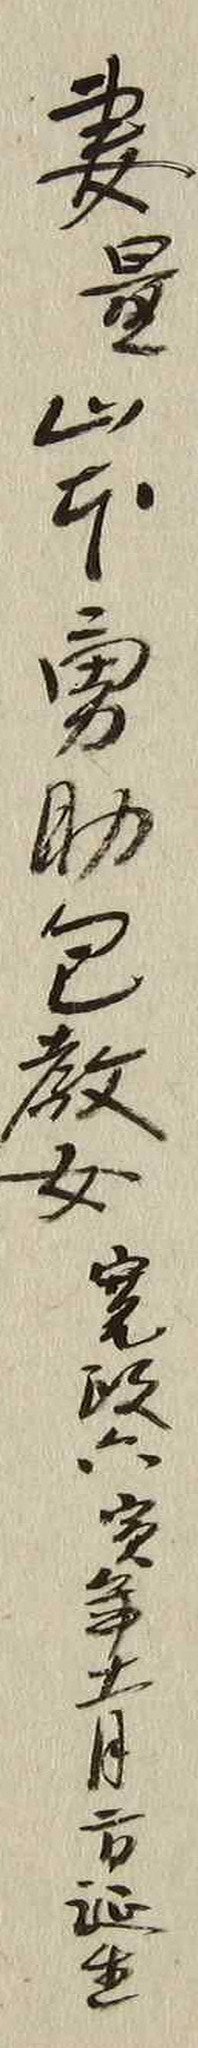妻量山本勇助包教女寛政六寅年十一月二日誕生
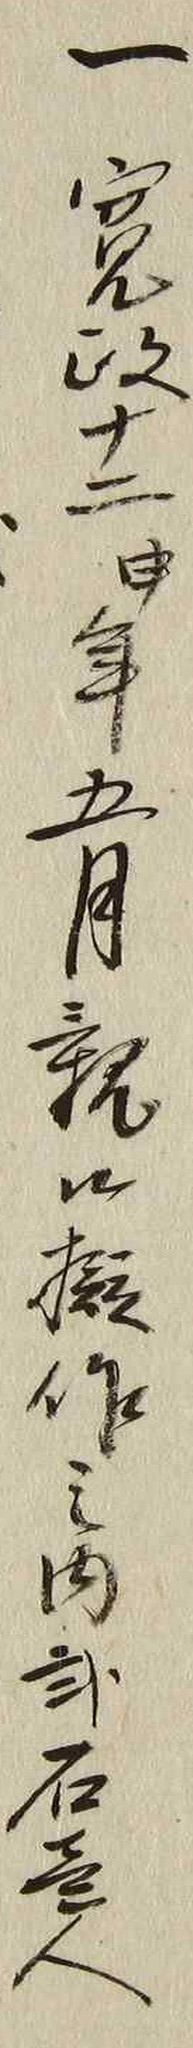一寛政十二申年五月親御擬作之内弐石壱人
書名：諸士系譜　巻之353　す之部3
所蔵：会津若松市立会津図書館
